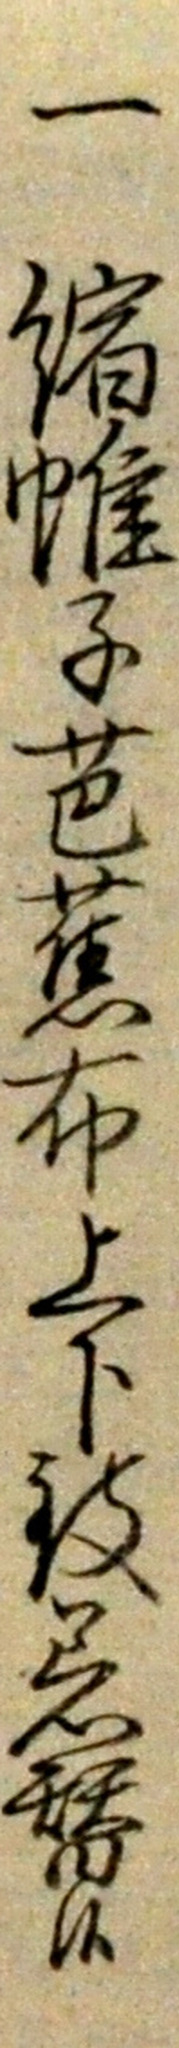一縮帷子芭蕉布上下致着替候
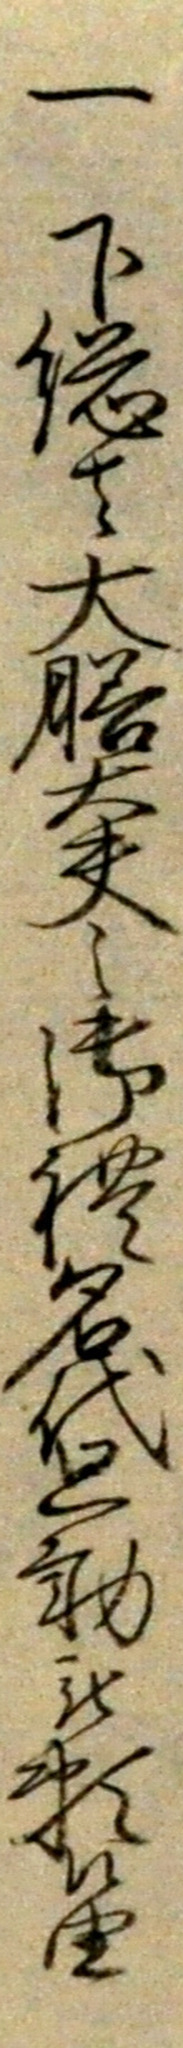一下総は大膳大夫之御礼名代廻勤被頼候由
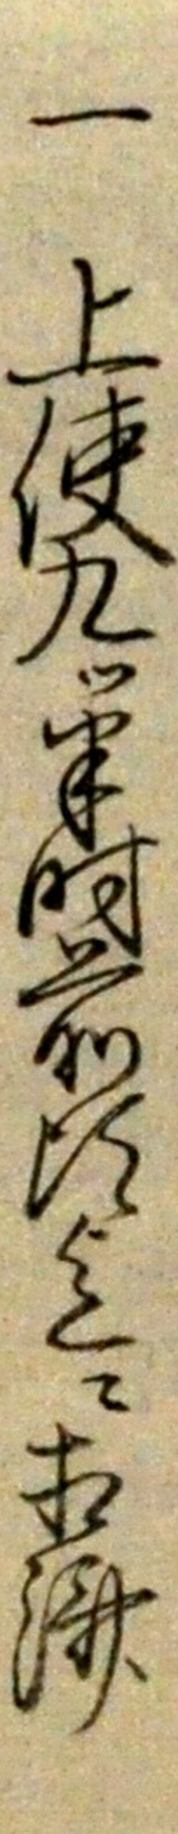一上使九ツ半時前頃迄ニ相済
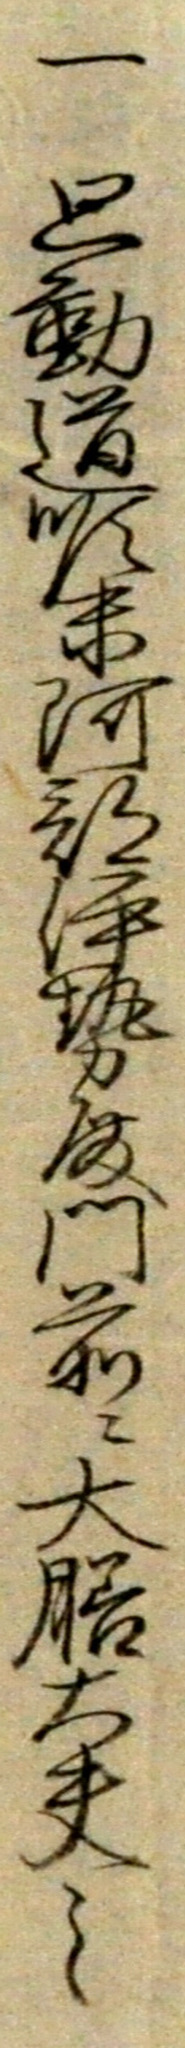一廻勤道順末阿部伊勢殿門前ニ大膳大夫之
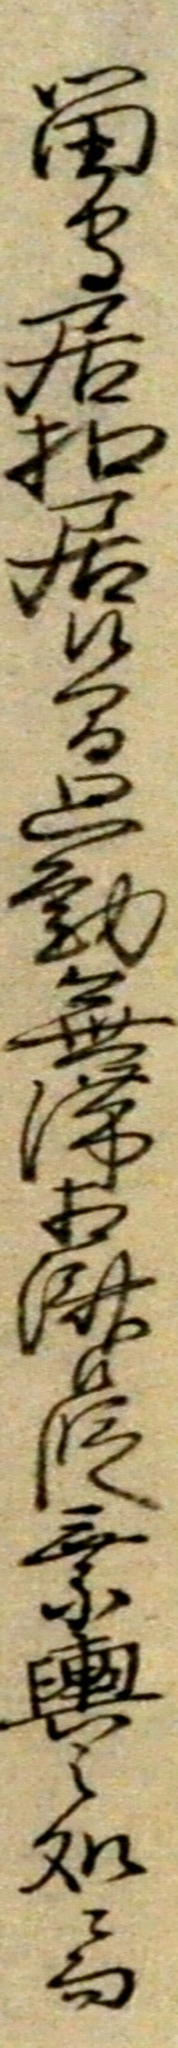留守居扣居り候間廻勤無滞相済候段乗輿之処ニ而
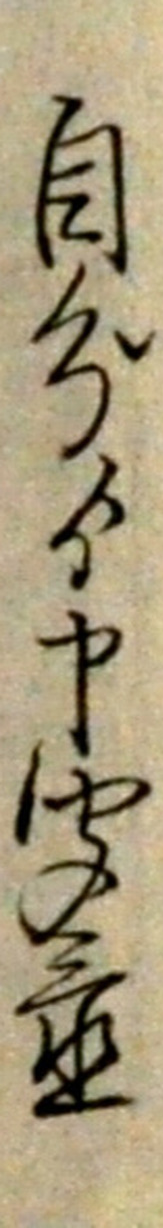自分ゟ申聞置
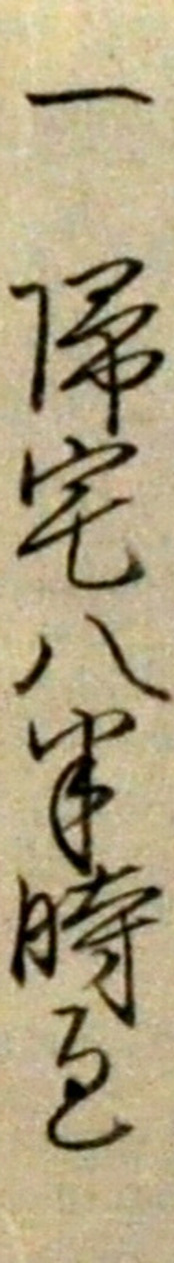一帰宅八半時過

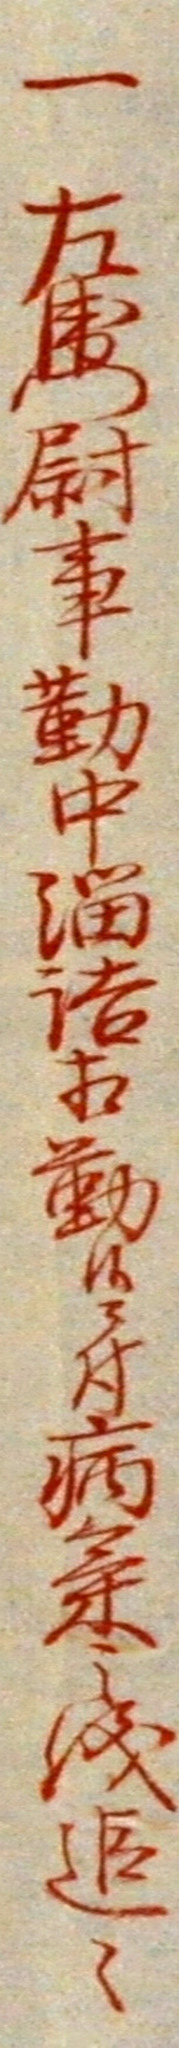一左衛門尉事勤中溜詰相勤候ニ付病気之儀追々
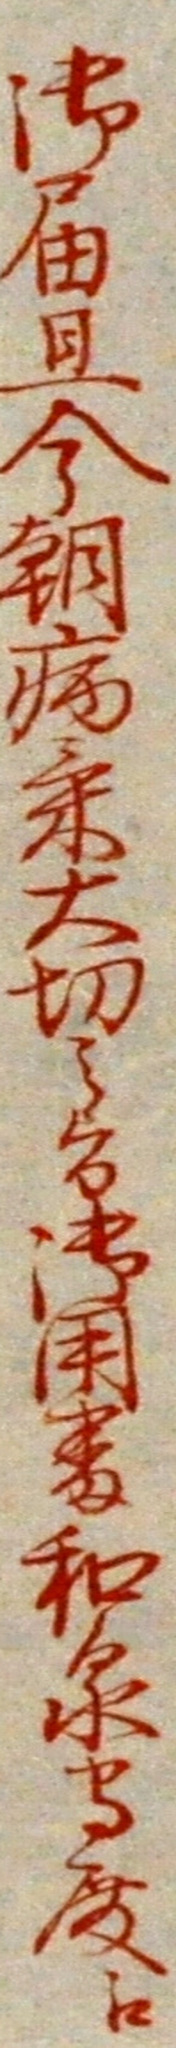御届且今朝病気大切之旨御用番和泉守殿え
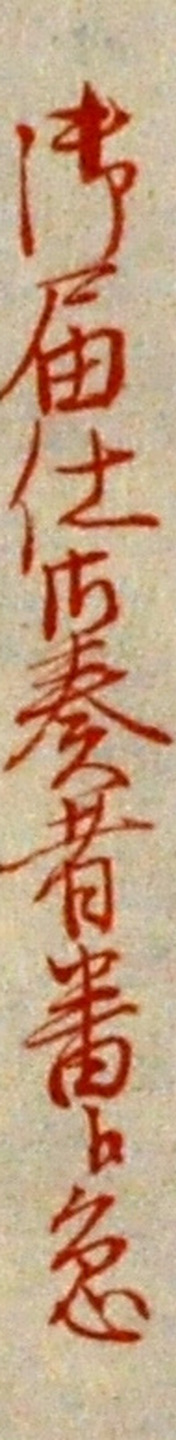御届仕御奏者番え急
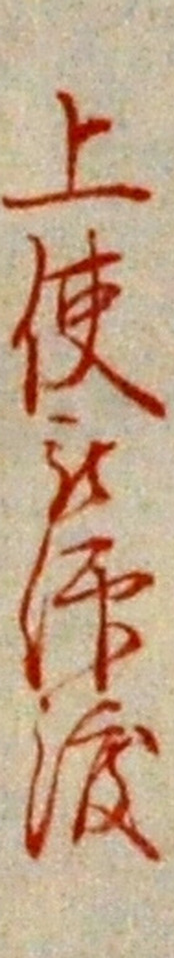上使被仰渡
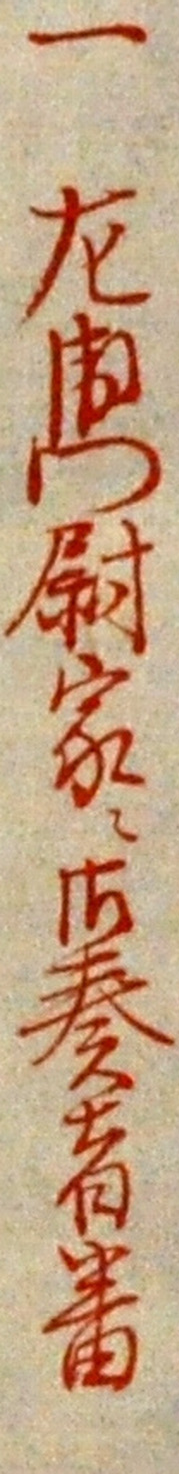左衛門尉家ニ御奏者番
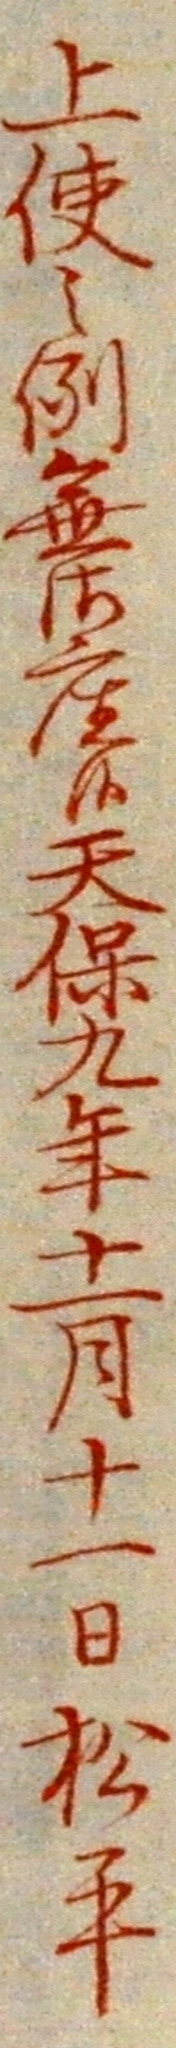上使之例無御座候天保九年十一月十一日松平
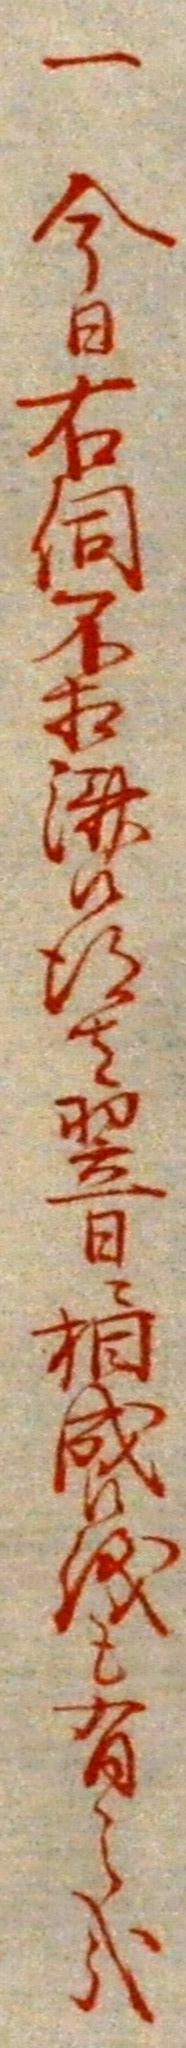今日右伺不相済候得は翌日ニ相成候儀も有之哉

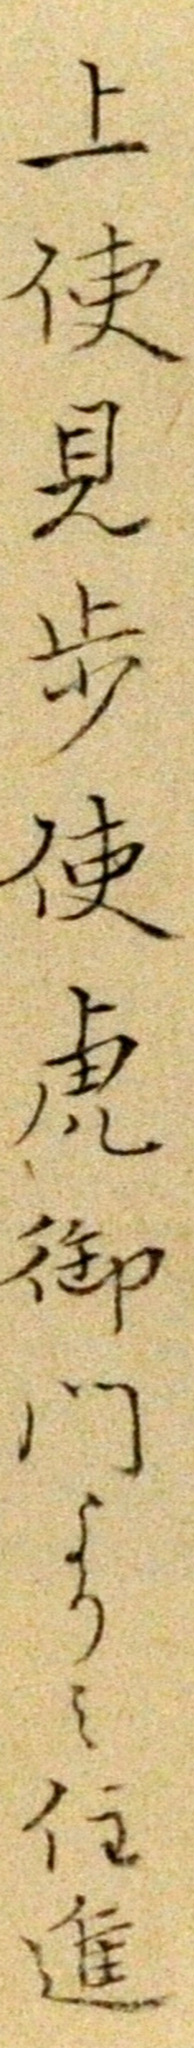上使見歩使虎御門より之注進
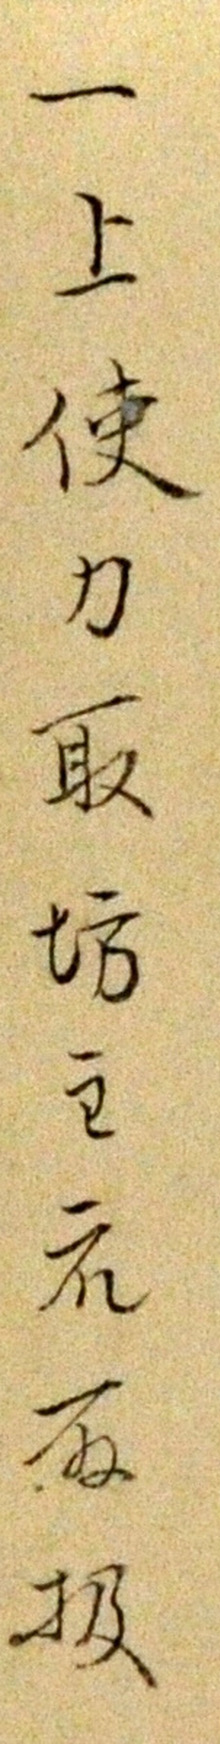一上使刀取坊主衆取扱
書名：上使仰付ラレ候節ノ留外
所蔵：伊那市立高遠町図書館・合同会社AMANE
